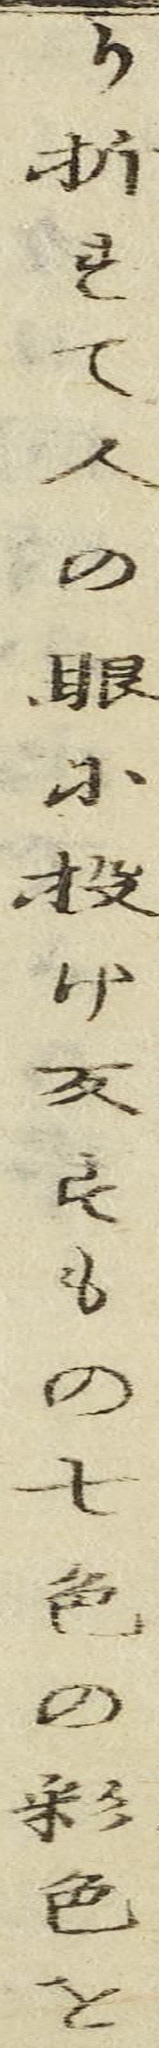り折れて人の眼に投げ反すもの七色の彩色を
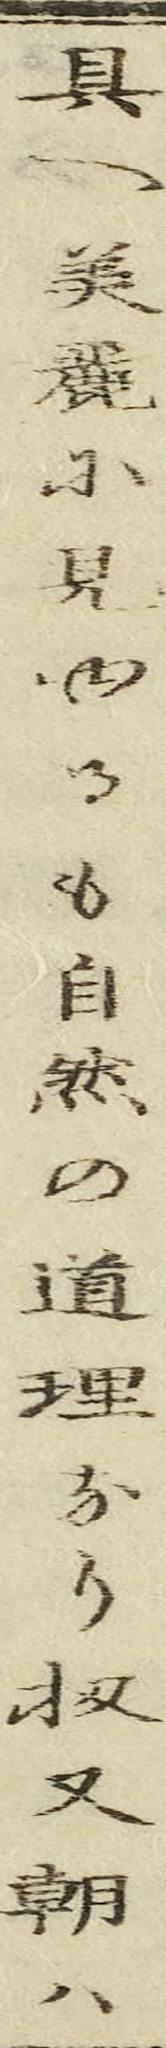具へ美麗に見ゆるも自然道理なり扨又朝は
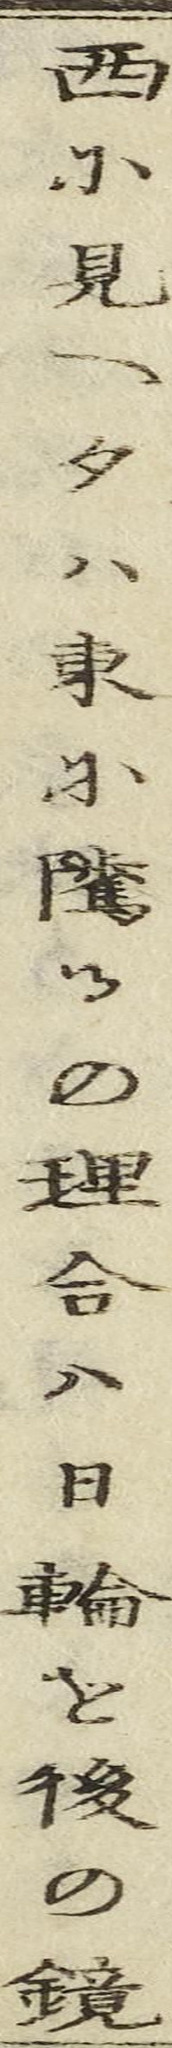西に見へ夕は東に騭るの理合は日輪を後の鏡
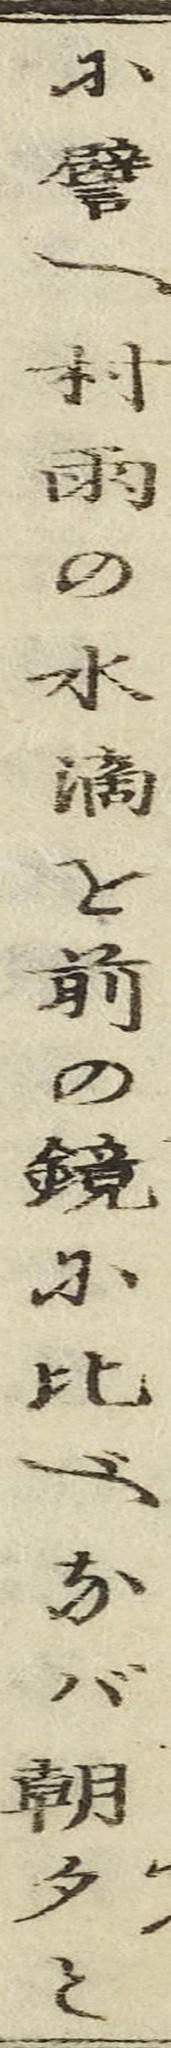に譬へ村雨の水滴を前の鏡に比べなば朝夕と
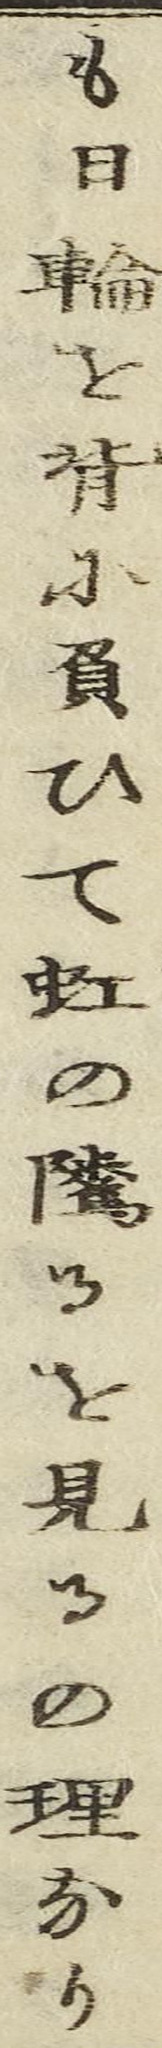も日輪を背に負ひて虹の騭るを見るの理なり
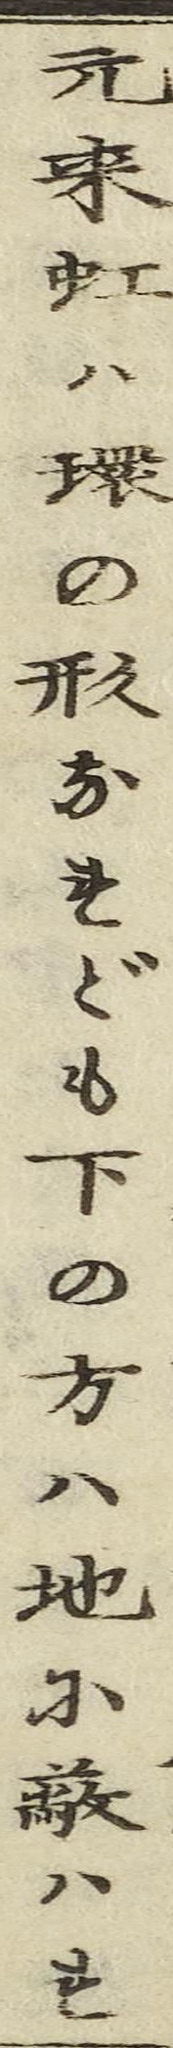元来虹は環の形なれども下の方は地に蔽はれ
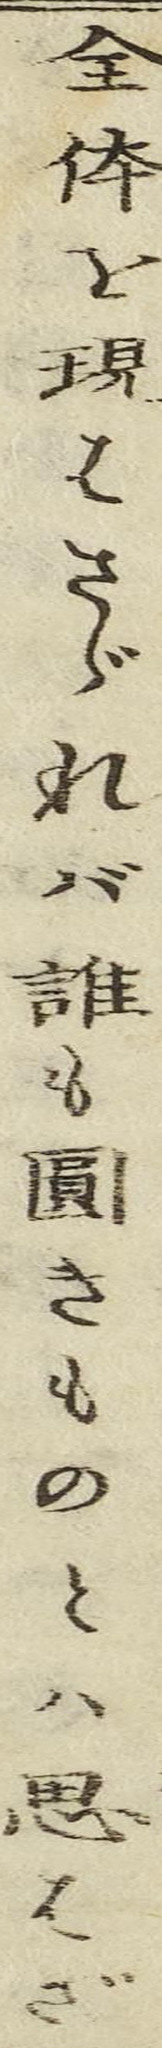全体を現はさゞれば誰も円きものとは思はざ
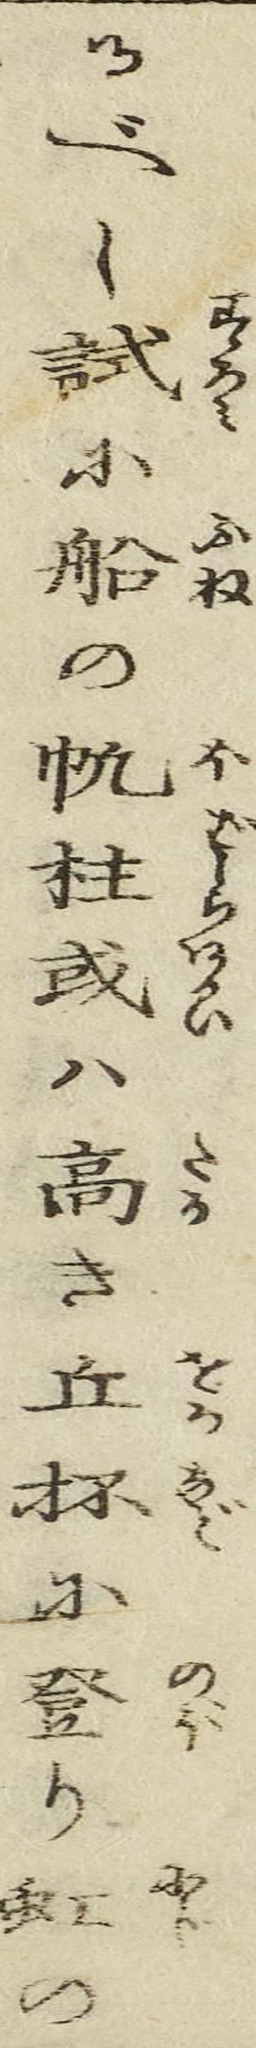るべし試に船の帆柱或は高き丘抔に登り虹の
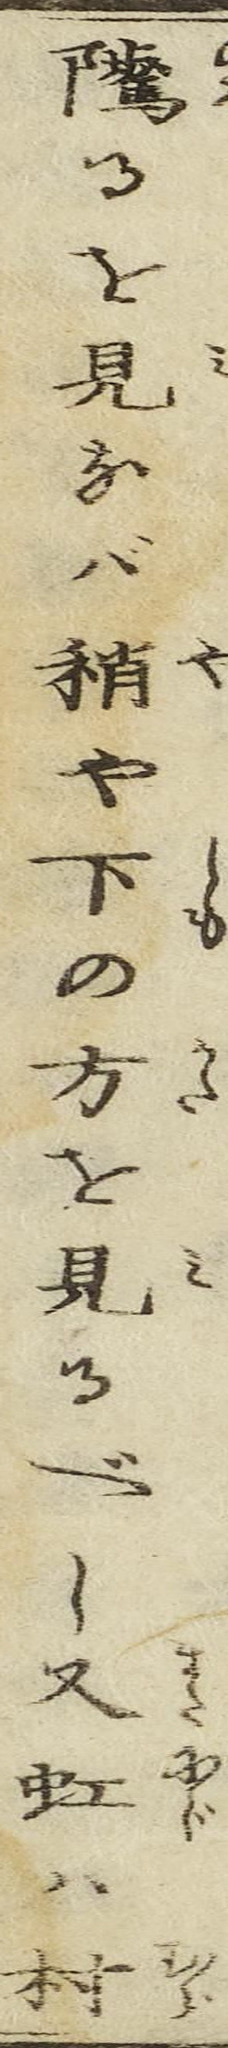騭るを見なば稍や下の方を見るべし又虹は村

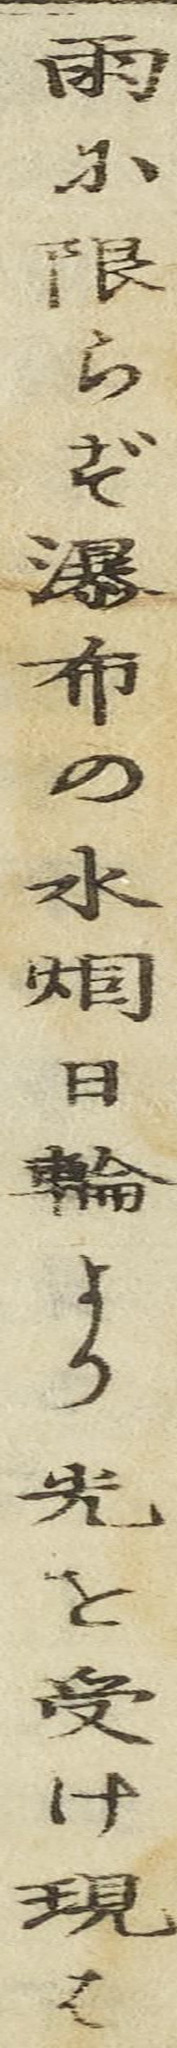雨に限らず爆布の水烟日輪より光を受け現は
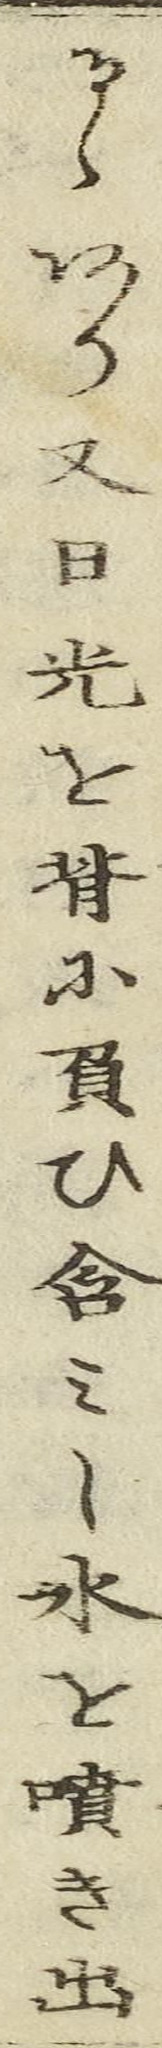るゝあり又日光を背に負ひ含みし水を噴き出
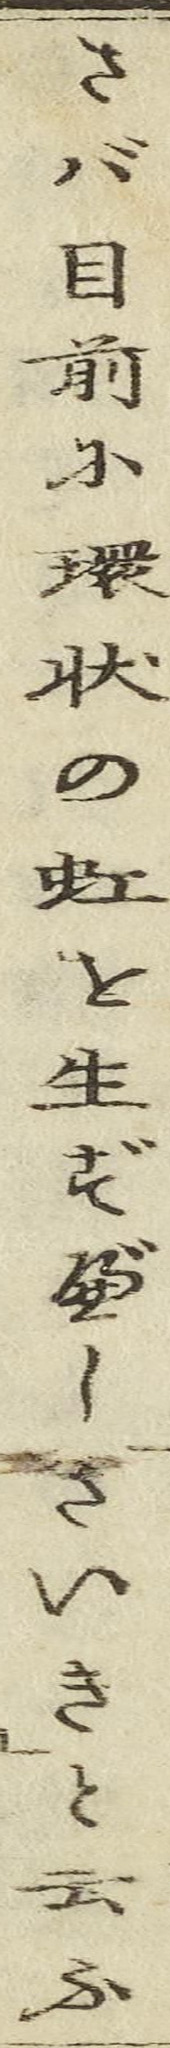さば目前に環状の虹を生ずべし「さいき」と云ふ
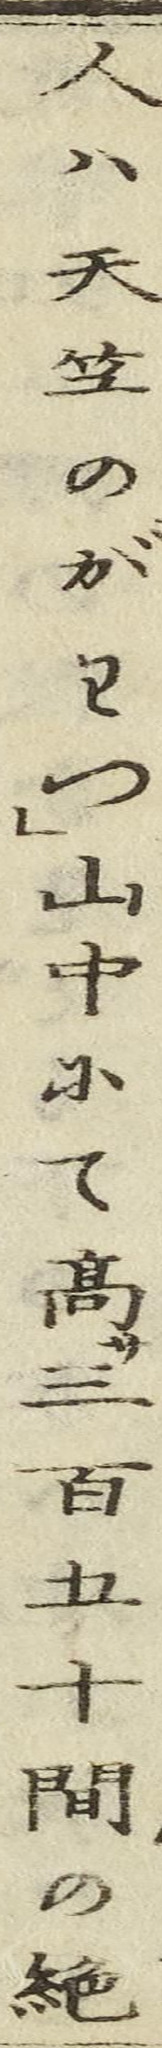人は天竺の「がわつ」山中にて高三百五十間の絶
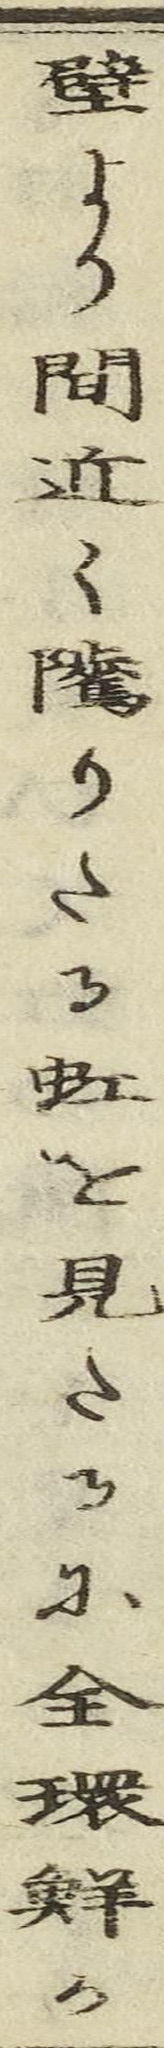壁より間近く騭りたる虹を見たるに全環鮮か
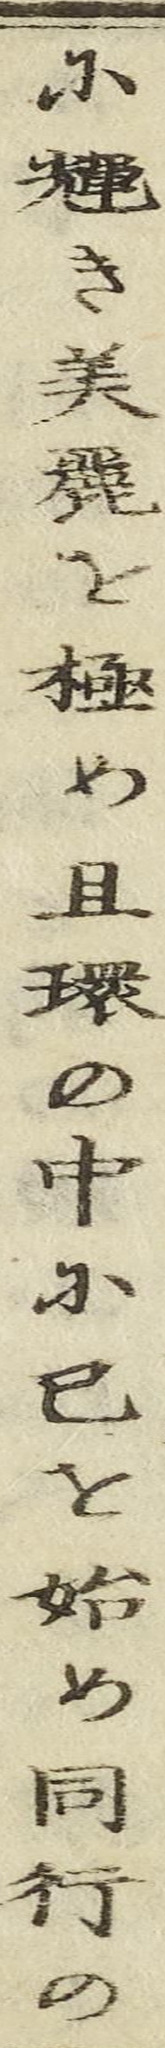に輝き美麗を極め且環の中に己を始め同行の
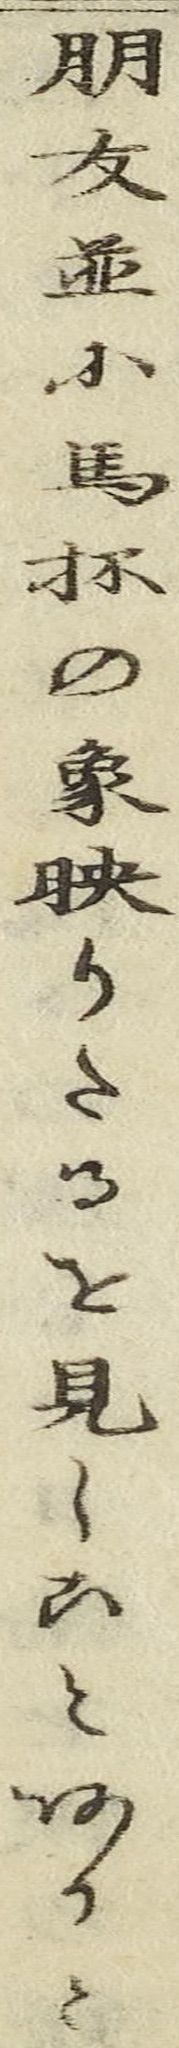朋友並に馬抔の象映りたるを見しことありと
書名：天変地異
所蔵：東京大学地震研究所図書室 Earthquake Research Institute Library, The University of Tokyo, JAPAN
